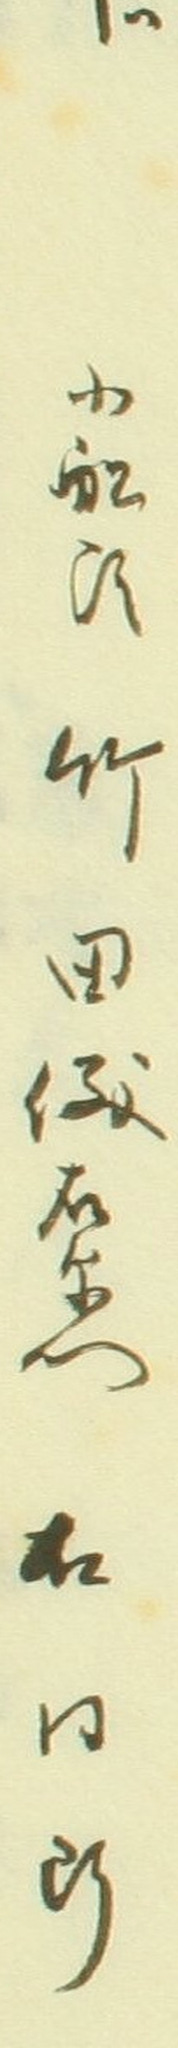一同小船頭竹田儀右衛門右同断
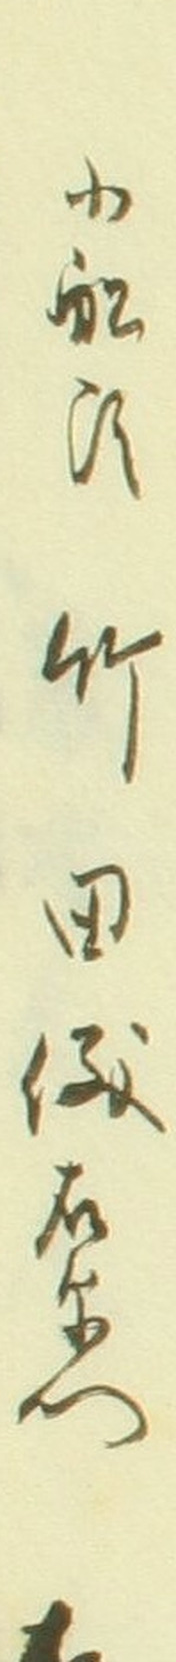一同小船頭用田与右衛門
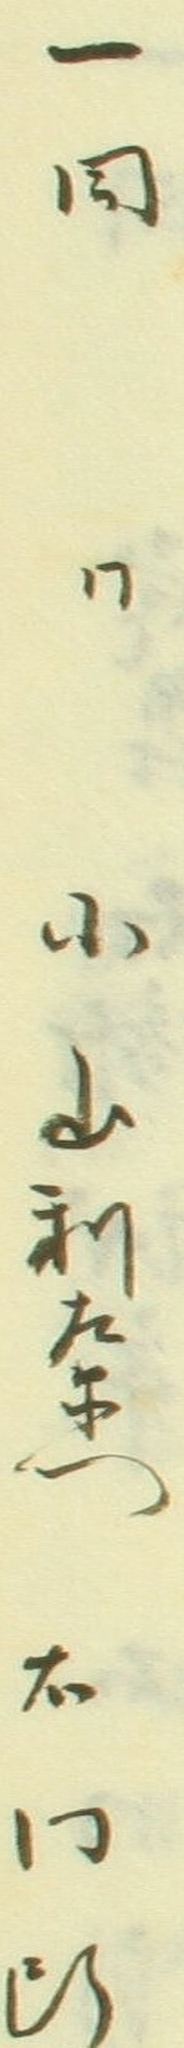一同同小山利左衛門右同断

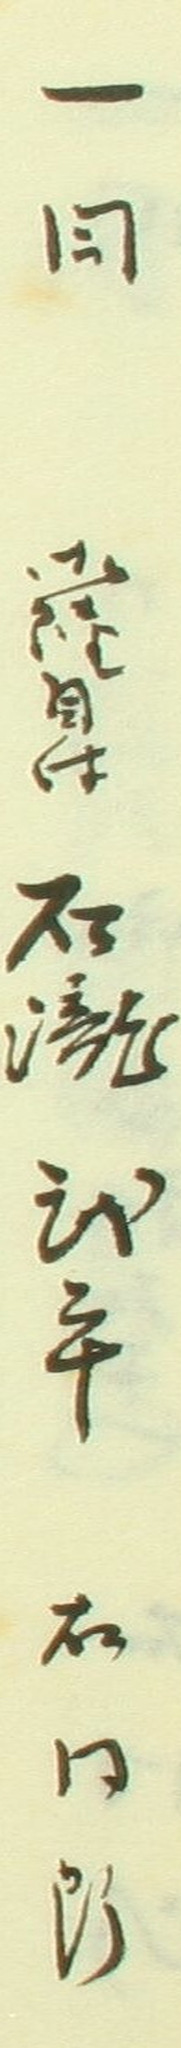一同御陸目付石瀧武平右同断
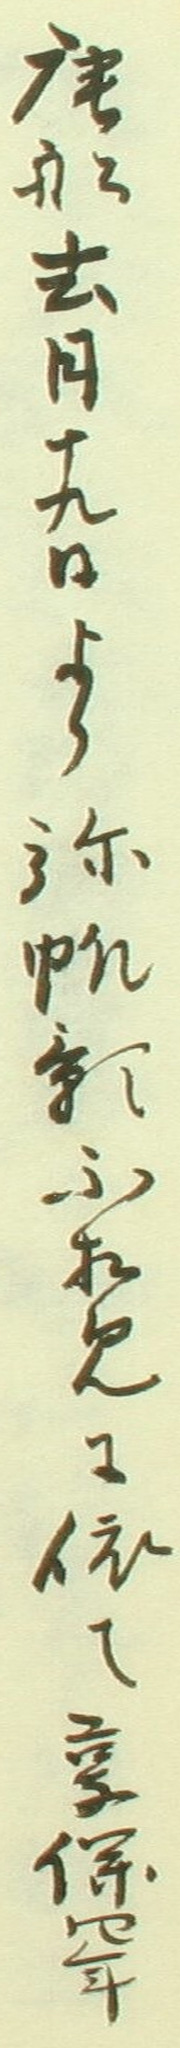唐船去月十九日より弥帆類不相見に依て享保よｎ四年
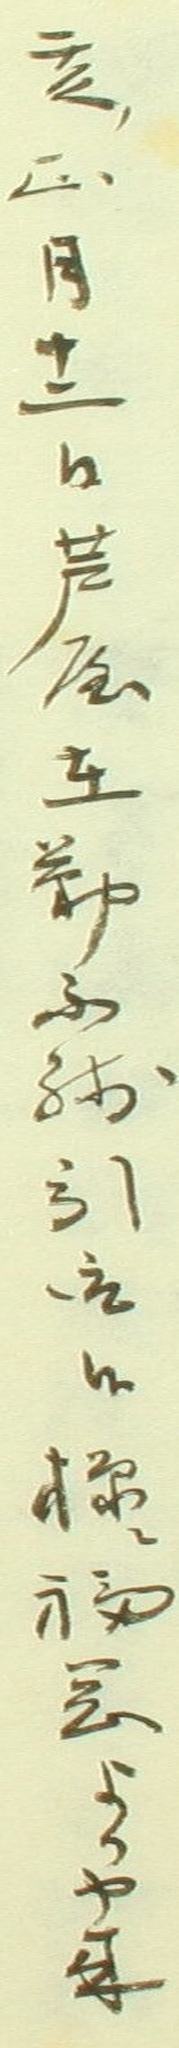亥正月十二日芦屋在勤不残引取候様に福岡より申来
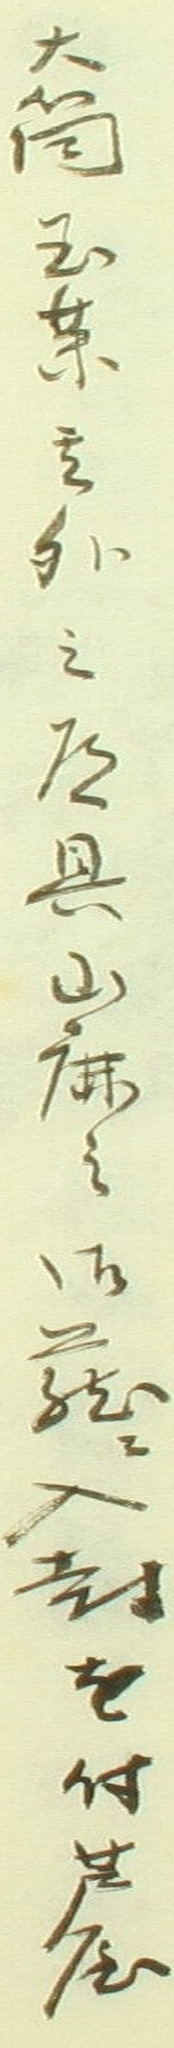大筒玉薬其外之道具山廉之御蔵に入封を付芦屋
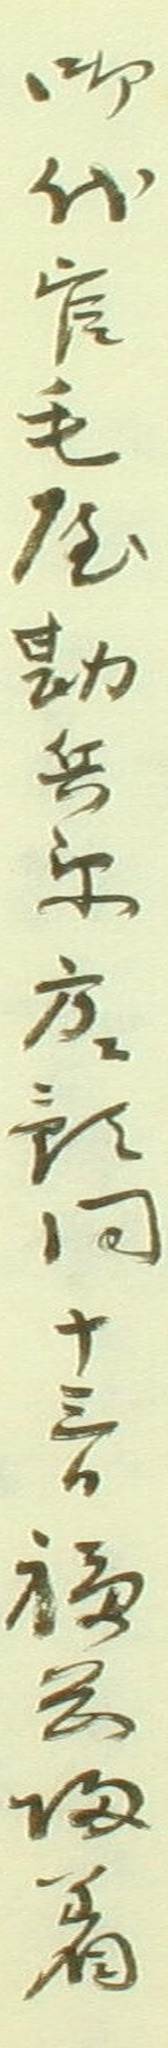御代官毛屋勘兵衛方に預同十三日福岡帰着
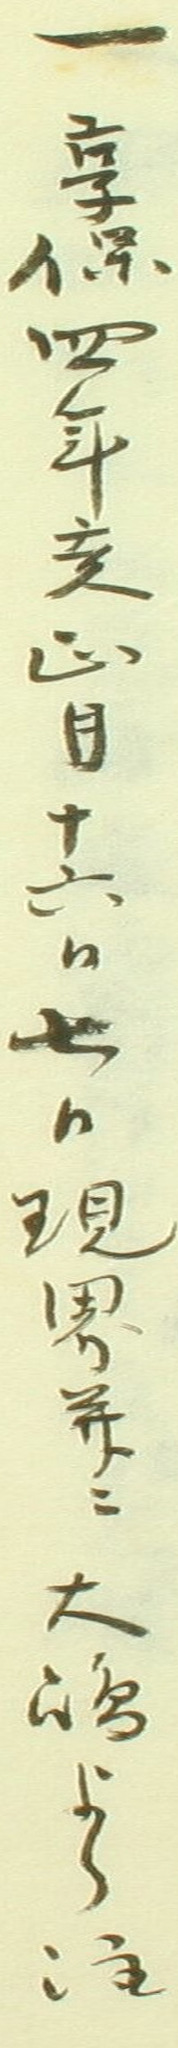一享保四年亥正月十六日七日現界並に大嶋より注
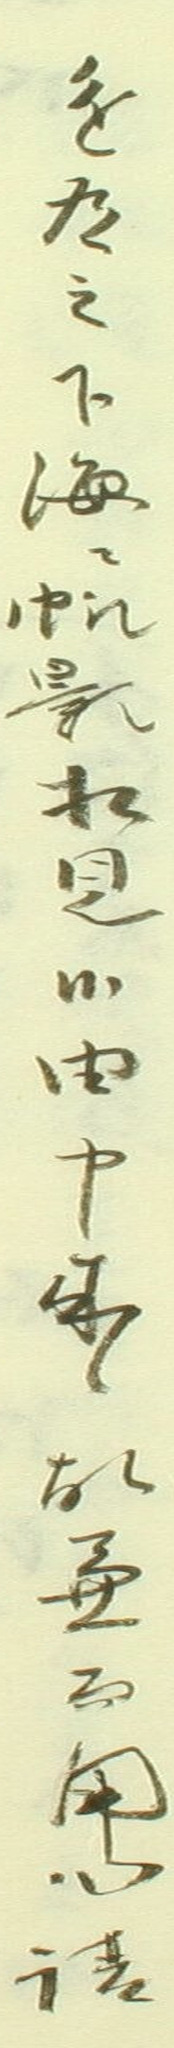進為之下海に帆影相見候由申来候故兼而用心請
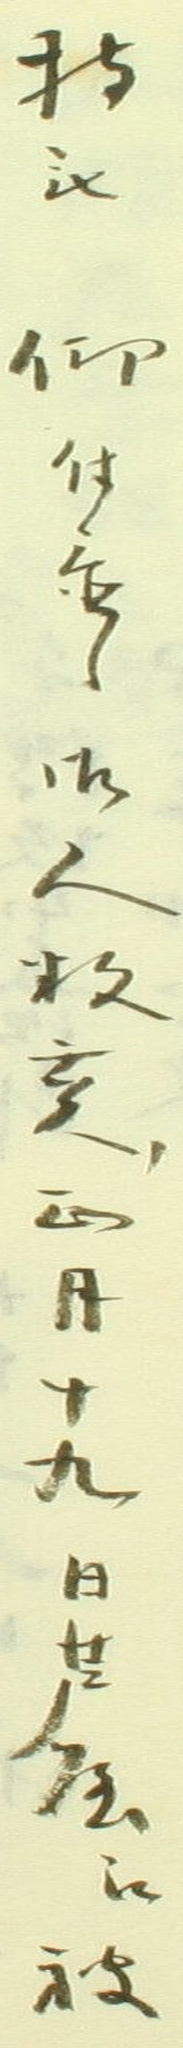持被仰付置候御人数亥の正月十九日芦屋江被
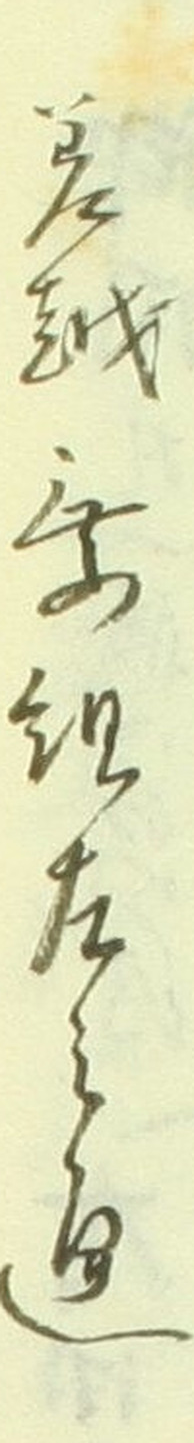差越乗組左之通
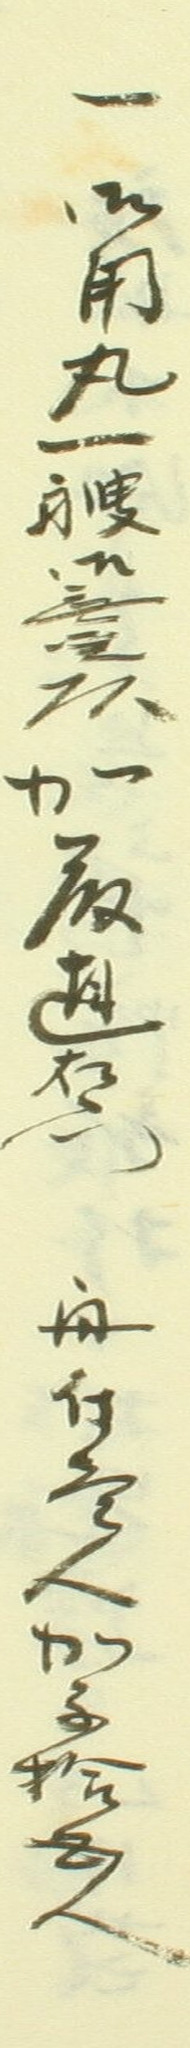一御用丸一艘御無足頭加藤直右衛門舟付壱人加子拾五人
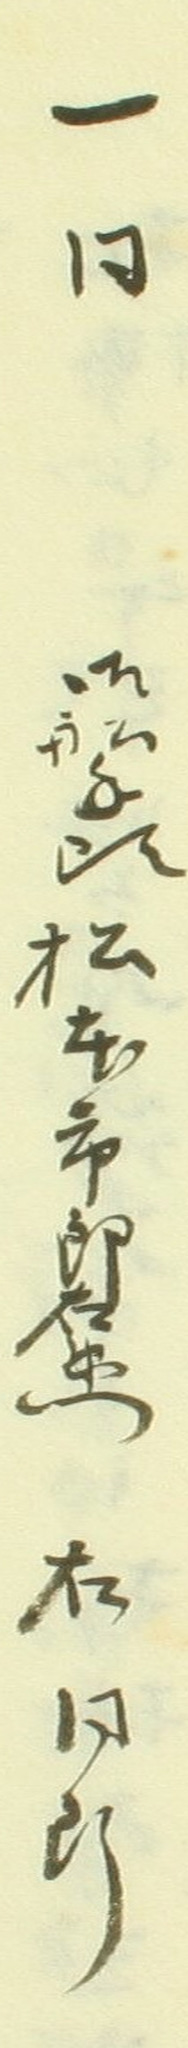一同御船手頭松本市郎右衛門右同断
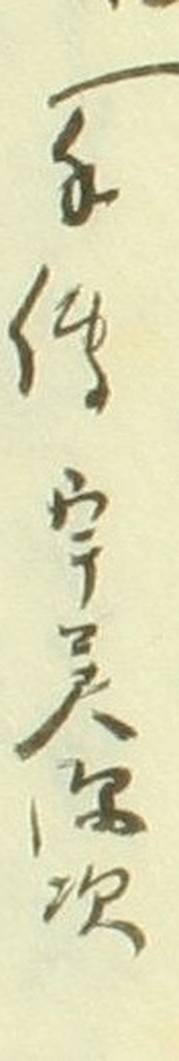手伝宇？源次
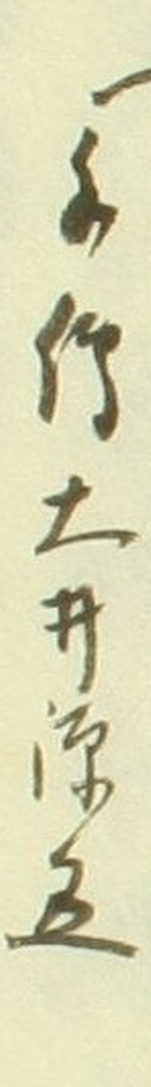手伝土井源五
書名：唐船漂流記 三
